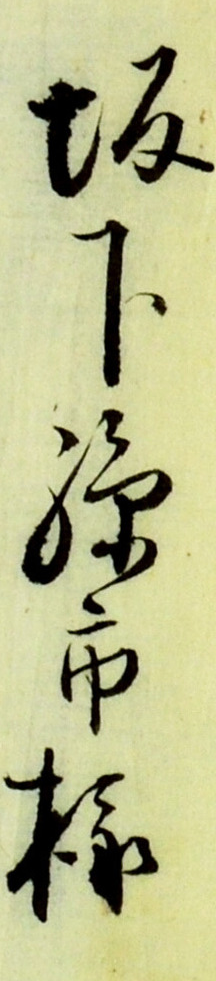坂下孫市様

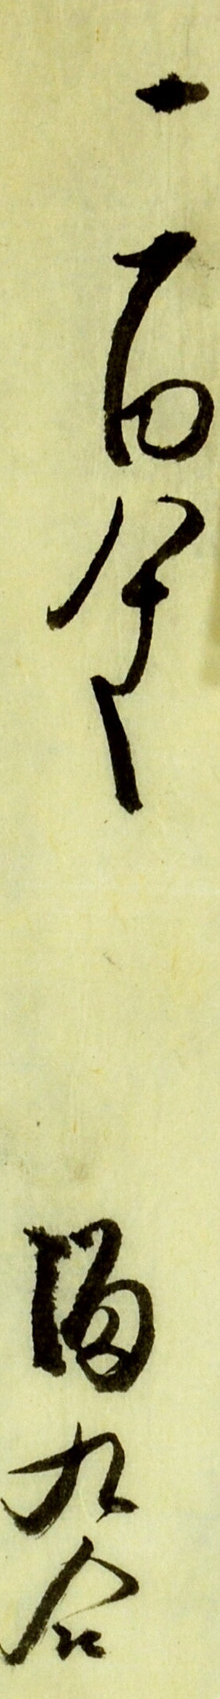一百八十文溜九合
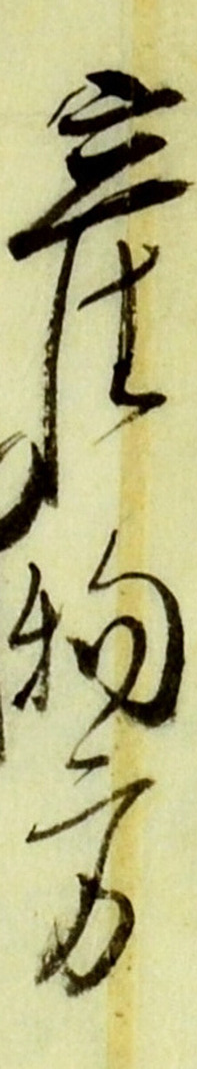産物方
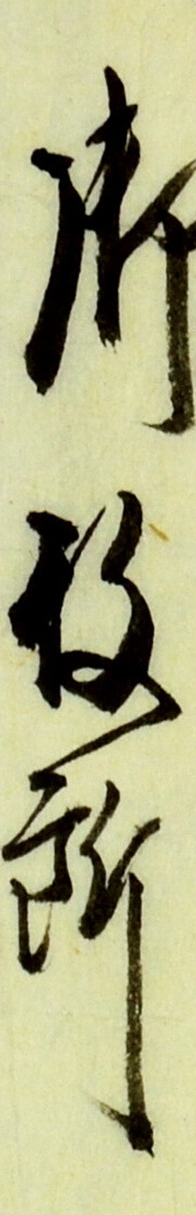御役所
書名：覚
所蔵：伊那市立高遠町図書館・合同会社AMANE
